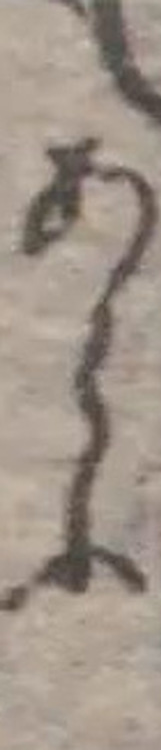あらふ
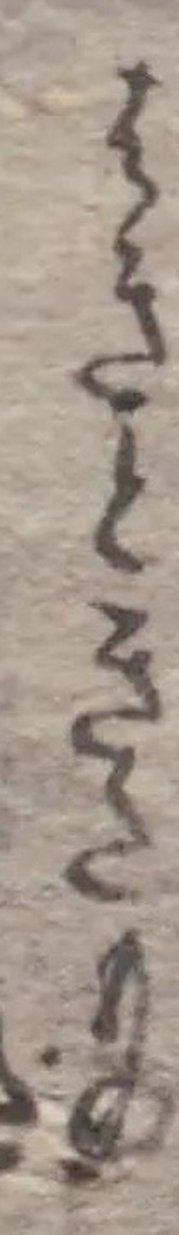はきときたものだ

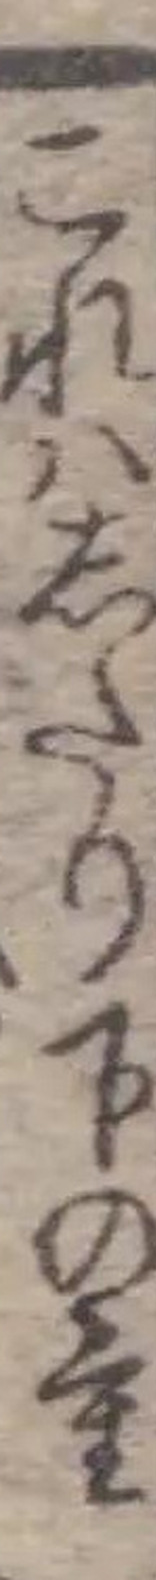これはしたり下の重
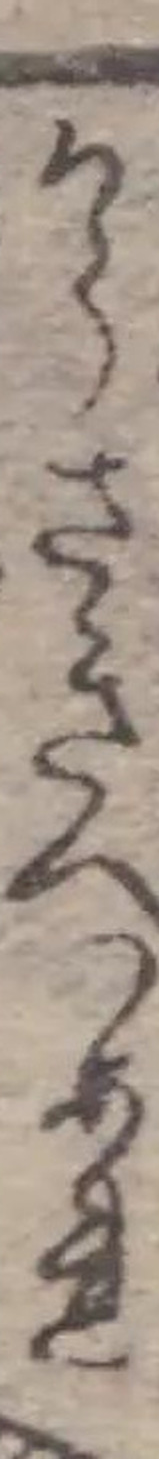からさきへつめれ
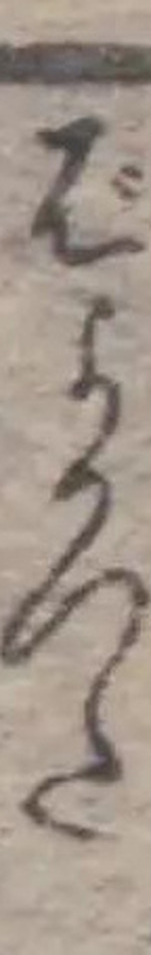ばよかつた
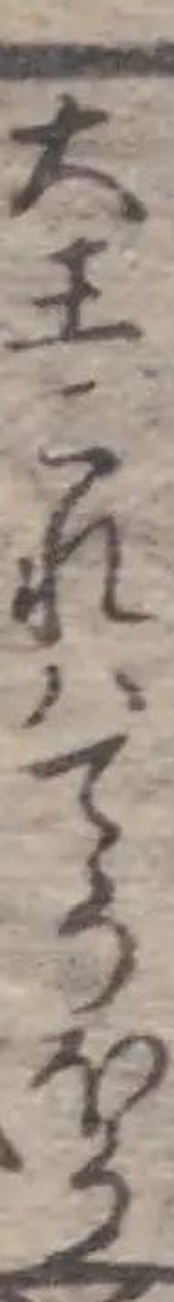大王これはてうほう
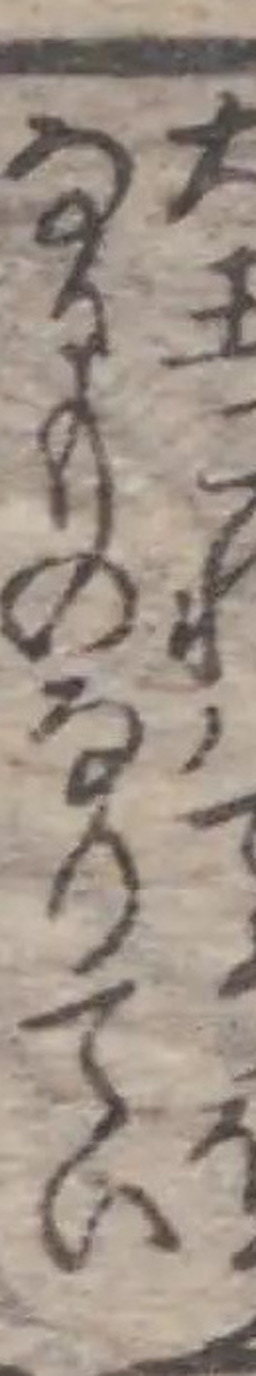なるものなりてい
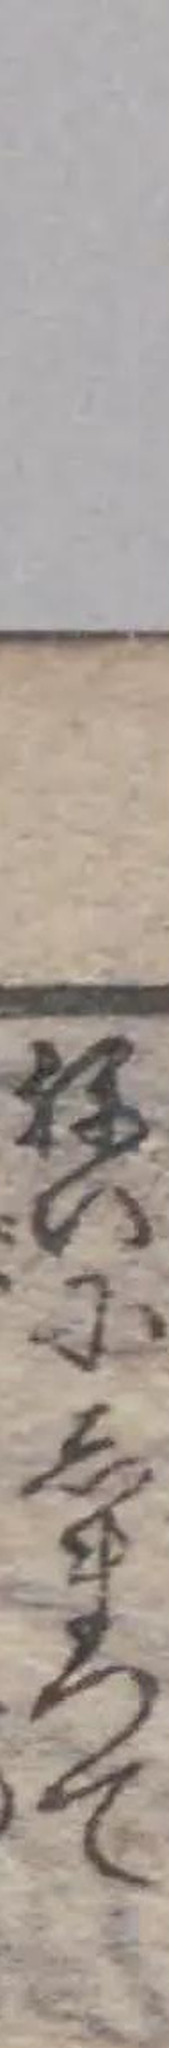ねいにしまつて
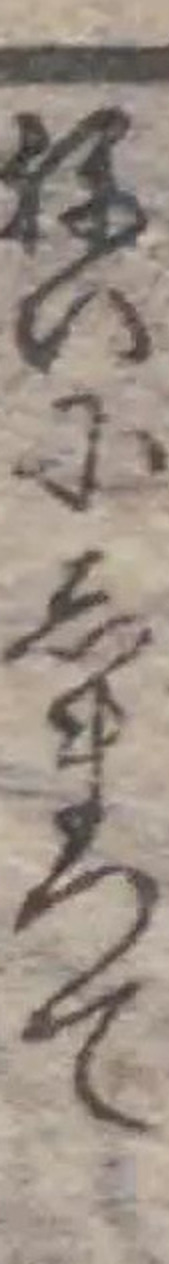ねいにしまつて
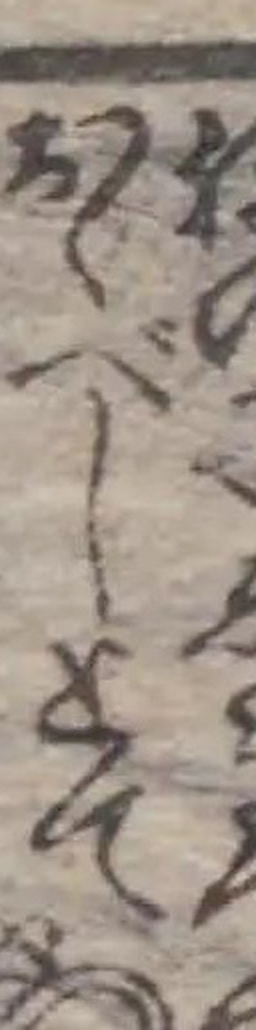おくべしとて
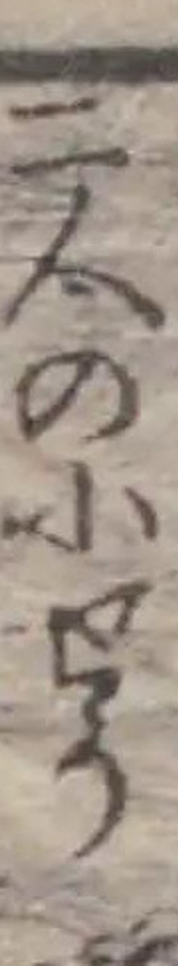二人の小せう
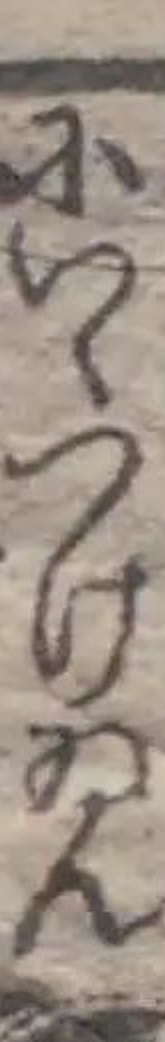にいゝつけゐん
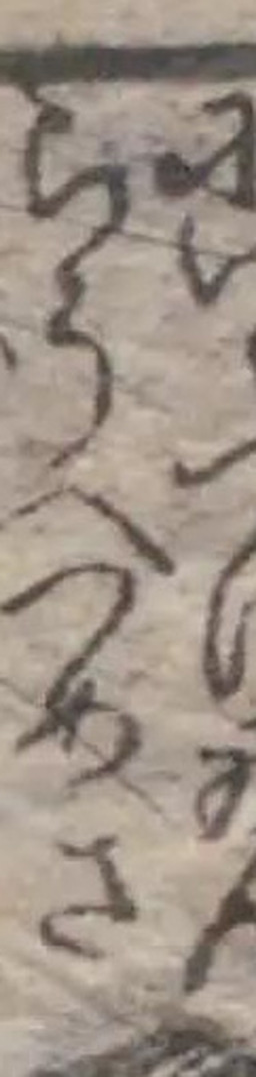らうへつめさ
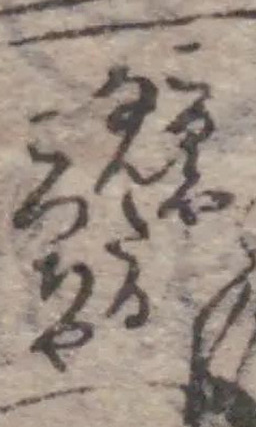こつちや
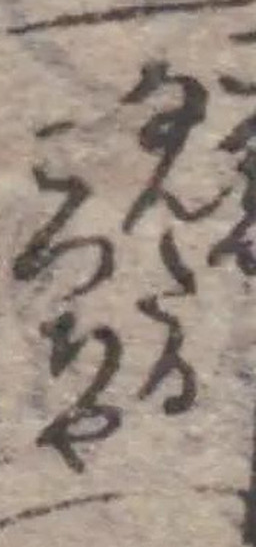こつちや
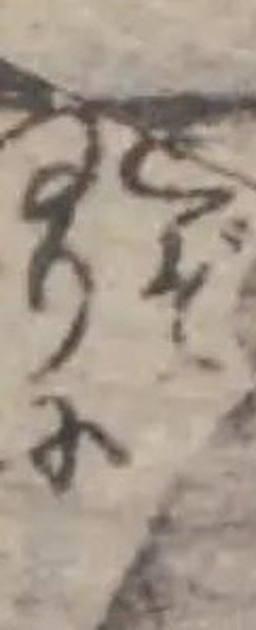なりに
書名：五たいそう
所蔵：国立国会図書館 National Diet Library, JAPAN
